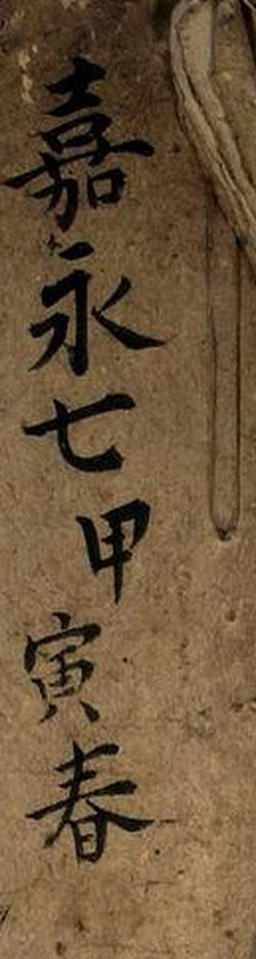嘉永七甲寅春
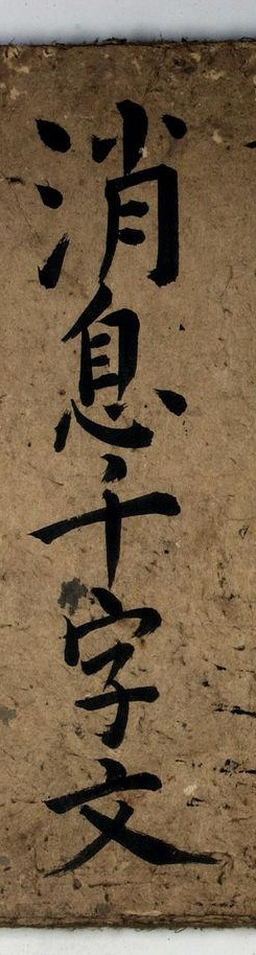消息千字文

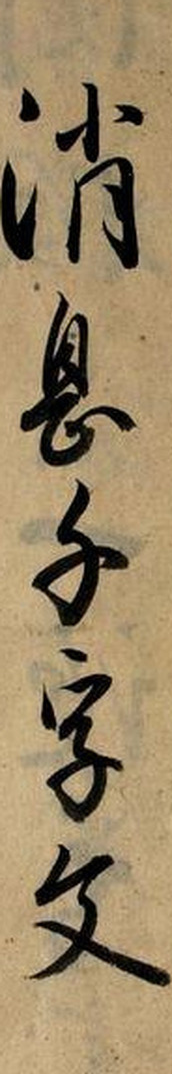消息千字文
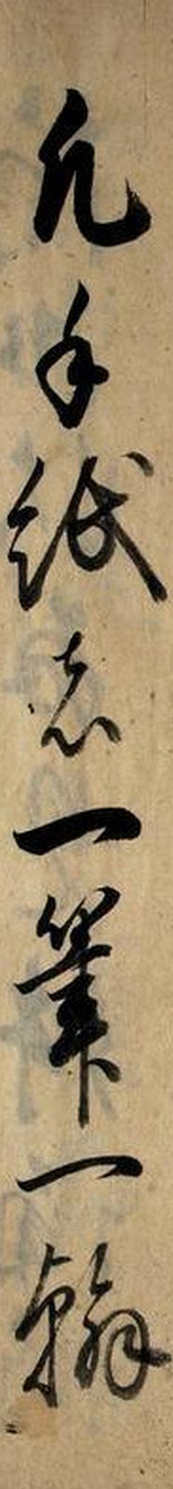凡手紙者一筆一翰
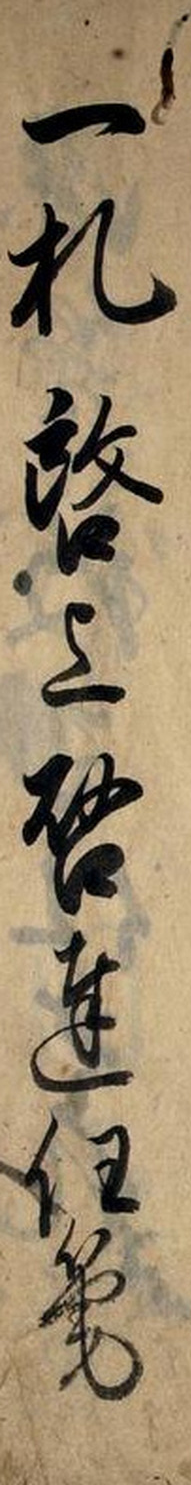一札啓上啓達任筆

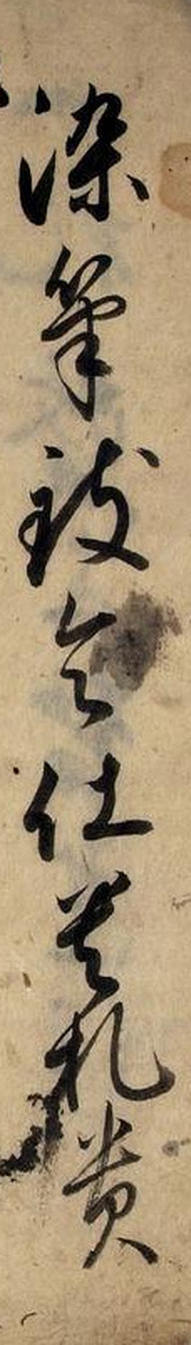染筆致令仕貴礼貴
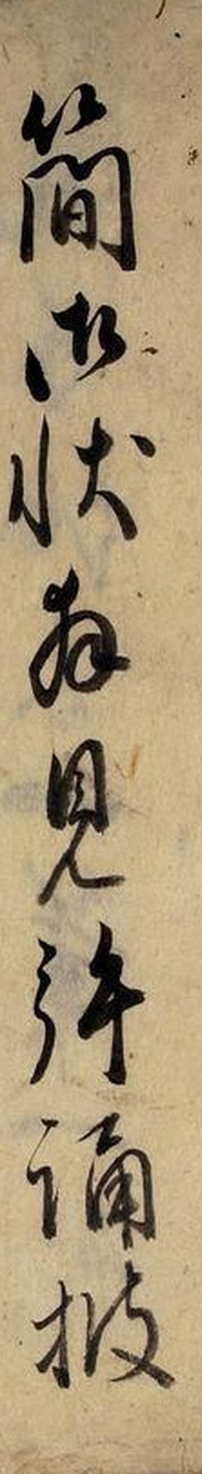簡御状拝見拝誦披
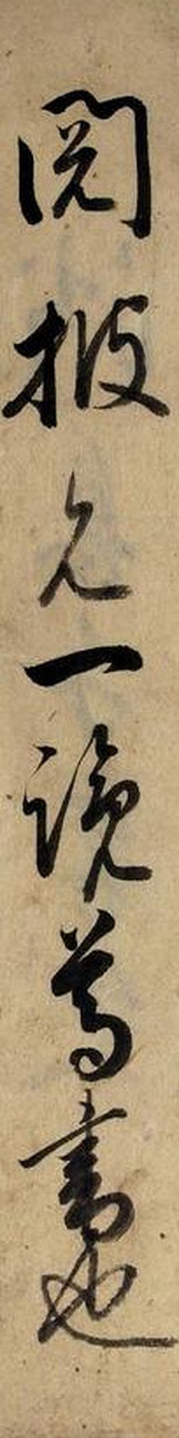閲披見一覧尊書也
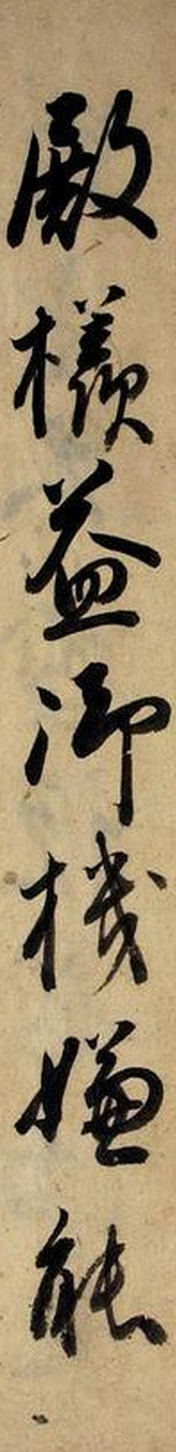殿様益御機嫌能
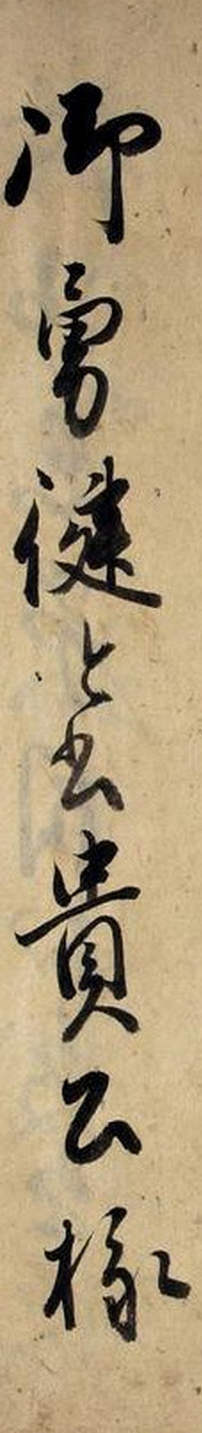御勇健と書貴公様
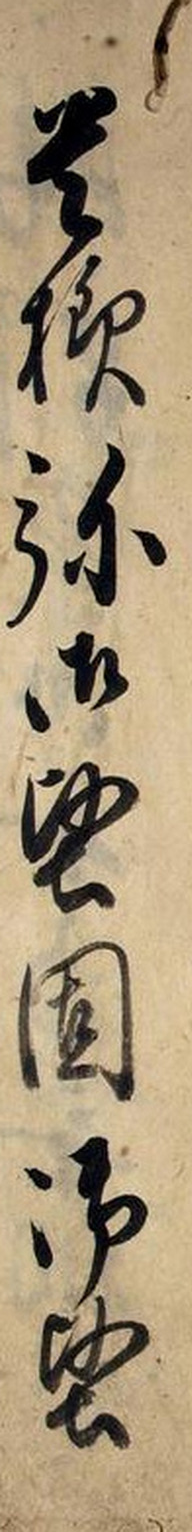貴様弥御堅固御堅

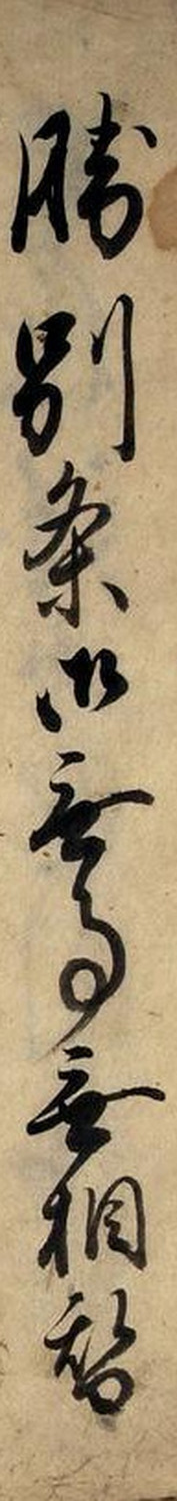勝別条御無事無相替
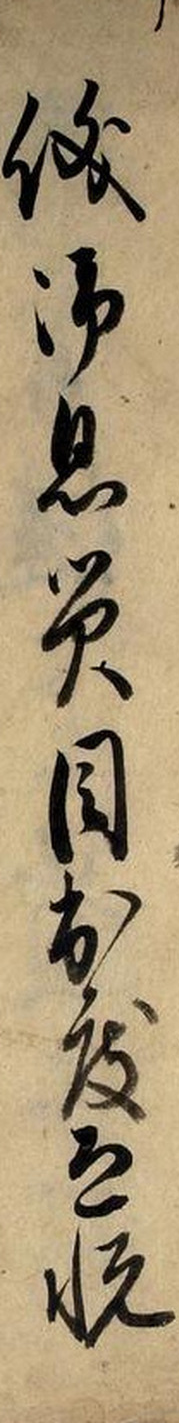儀御息災目出度恐悦
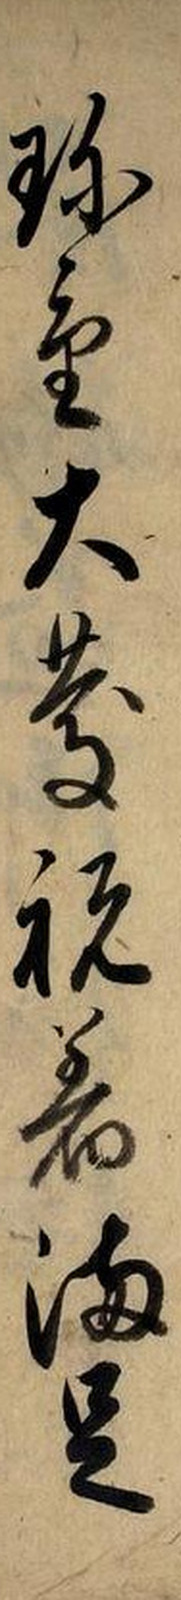珍重大慶祝着満足
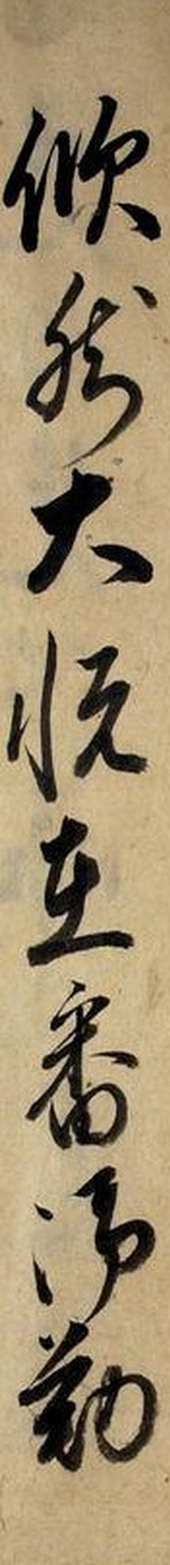欣然大悦在番御勤
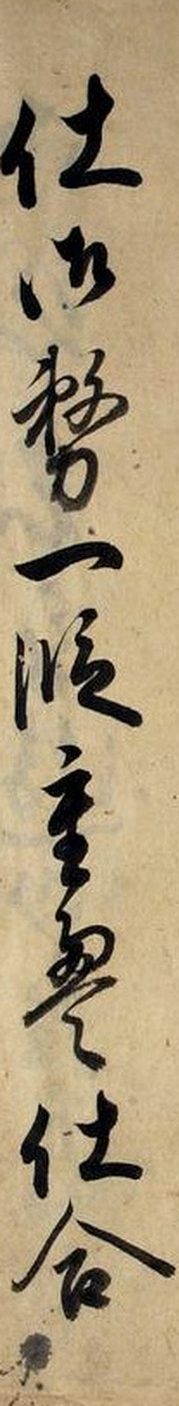仕御務一段重畳仕合
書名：消息千字文（往来物、手習手本）
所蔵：福井県文書館 Fukui Prefectural Archives
